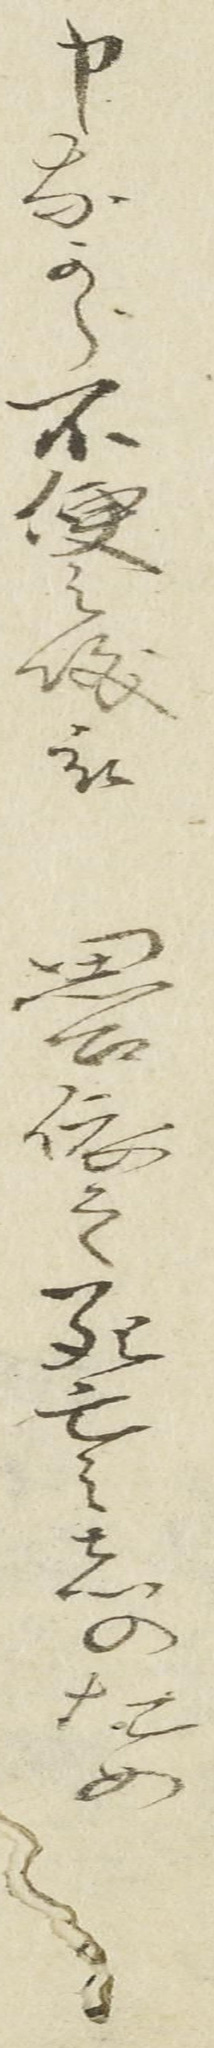申なから不便之儀被思召依之死亡之者のため
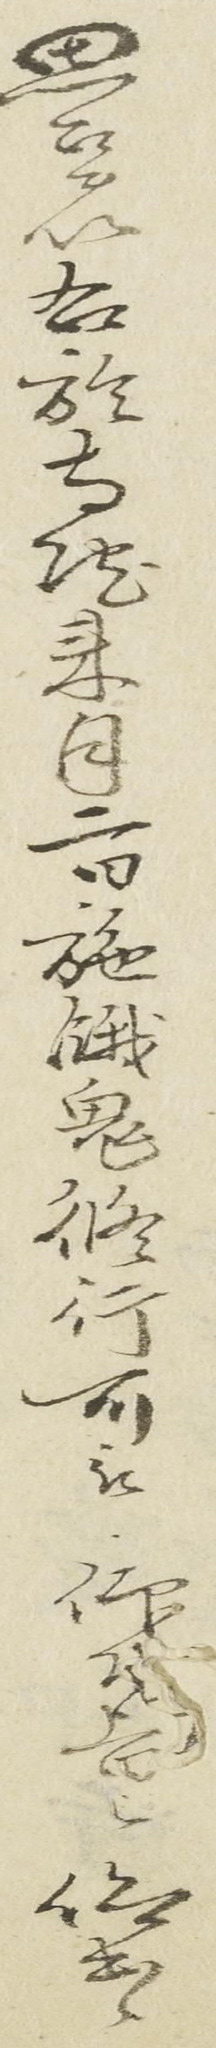思召ヲ以右於寺院来月二日施餓鬼修行可被仰付旨被仰出候
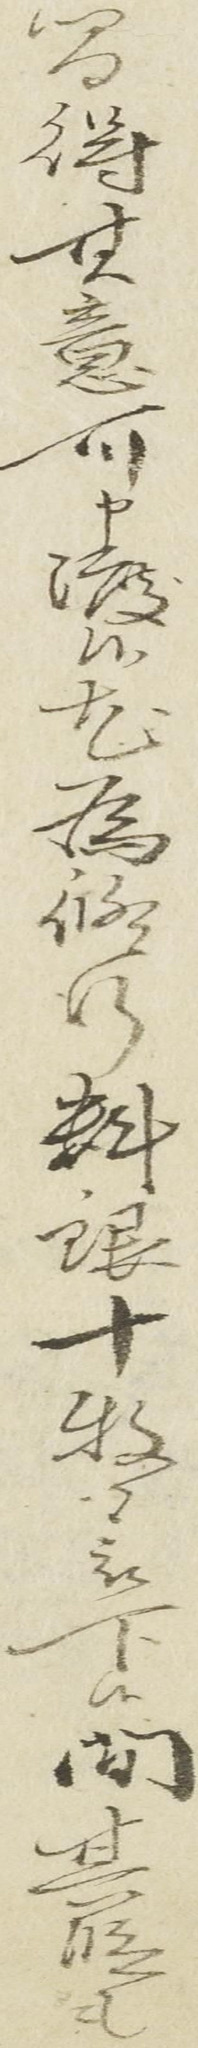間得其意可申渡候尤為修行料銀十枚ツ被下候間其段も
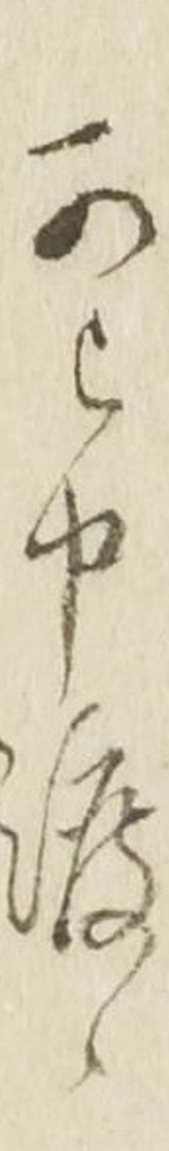可被申渡候
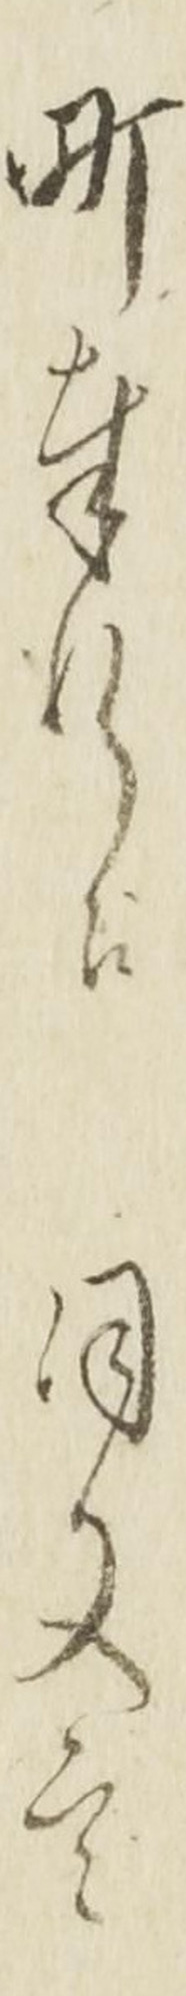町奉行え同文言
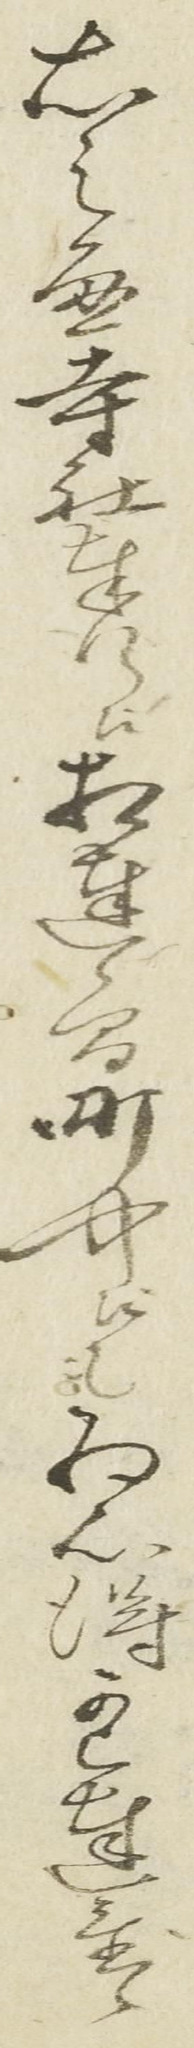右之通寺社奉行え相達候間町中えも為心得可被達置候
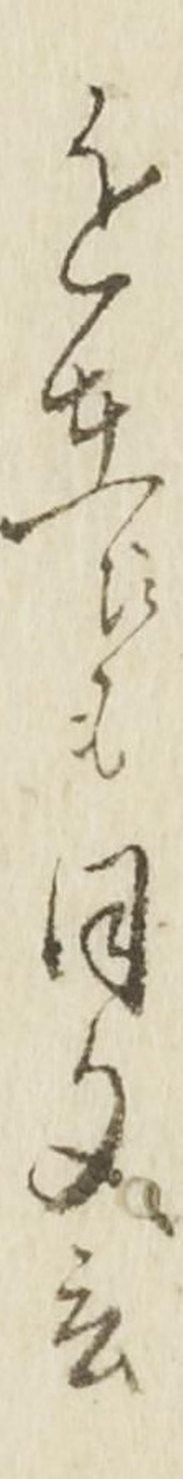近在にも同文言
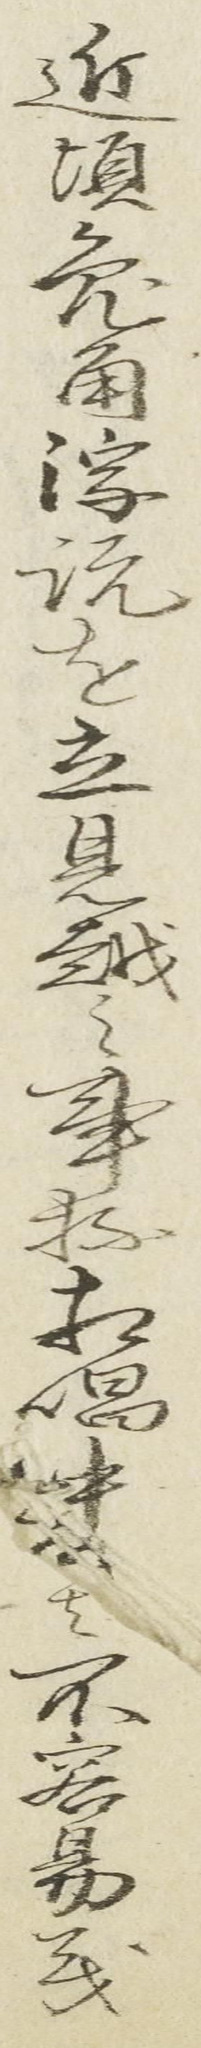近頃兎角浮説を立見越之事抔相唱申候者不容易義
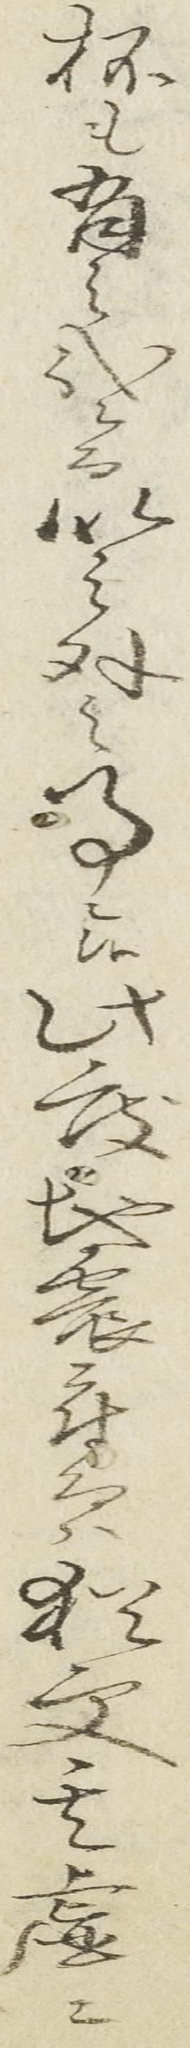抔も有之哉にて以之外之事に候此度地震に付ては猶更其虚に
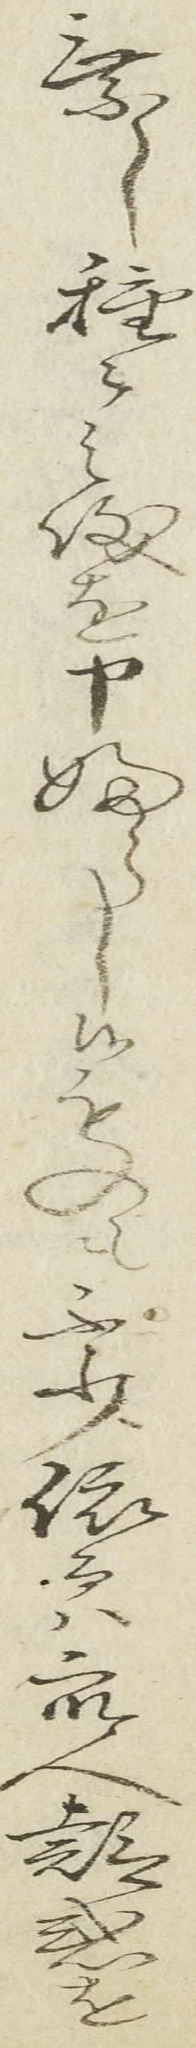乗し種々之儀を申ふらし候ものも不少依ては衆人疑惑を
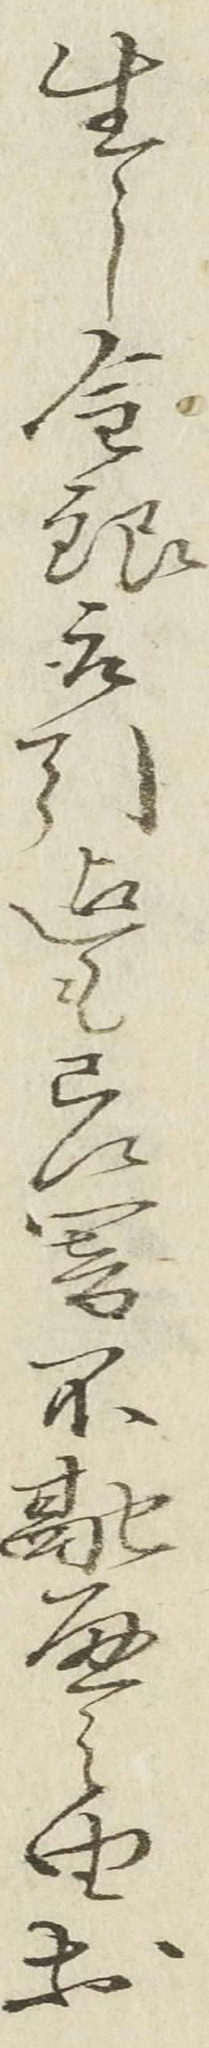生し金銀取引迄も差闇不融通之由於
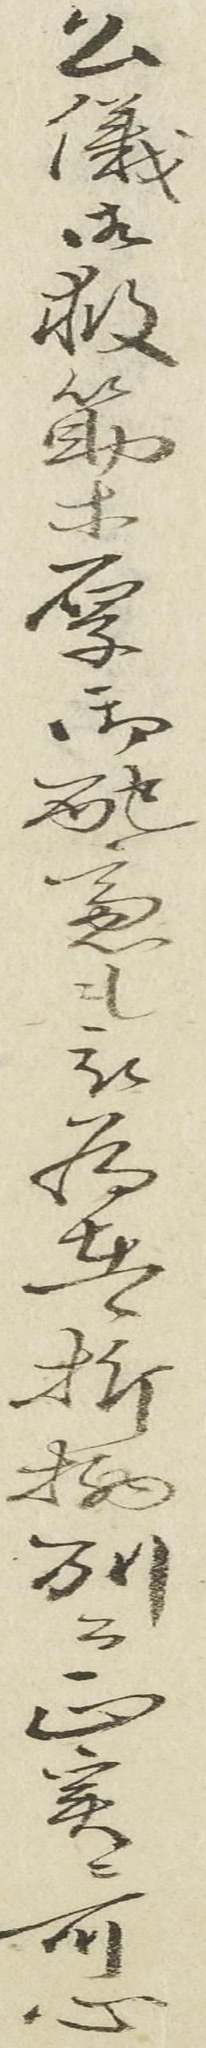公儀御救筋等厚御配慮も被為在候折柄別而正実ニ可心
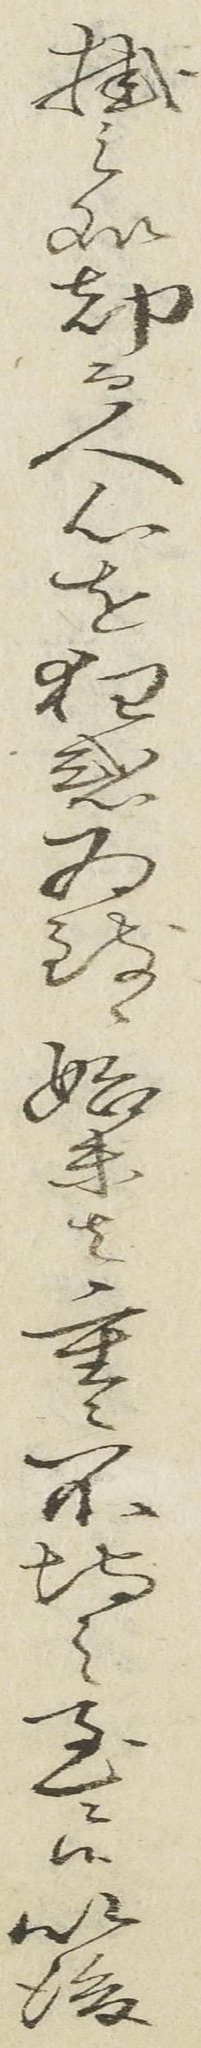掛之処却而人心を狂惑為致候始末ハ重々不埒之至ニ候以後
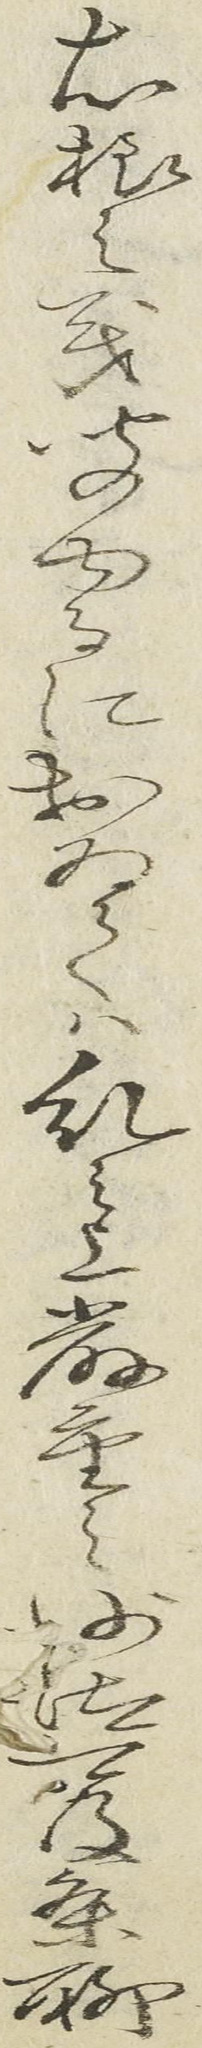右様之義聞ゆるにおいてハ糺之上厳重之沙汰可及条聊
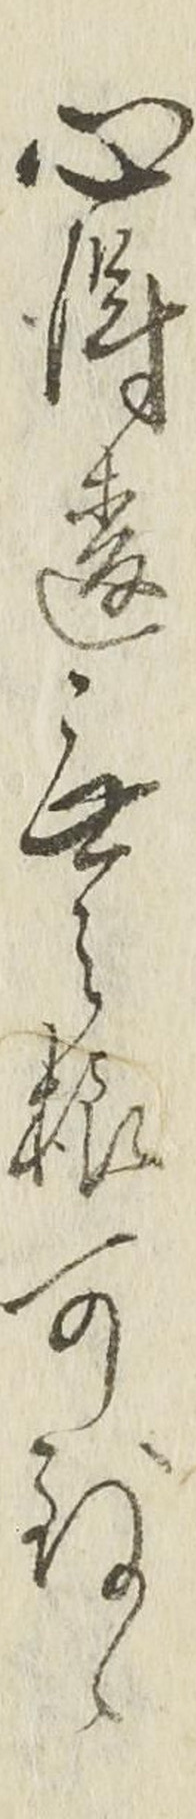心得違無之様可致候
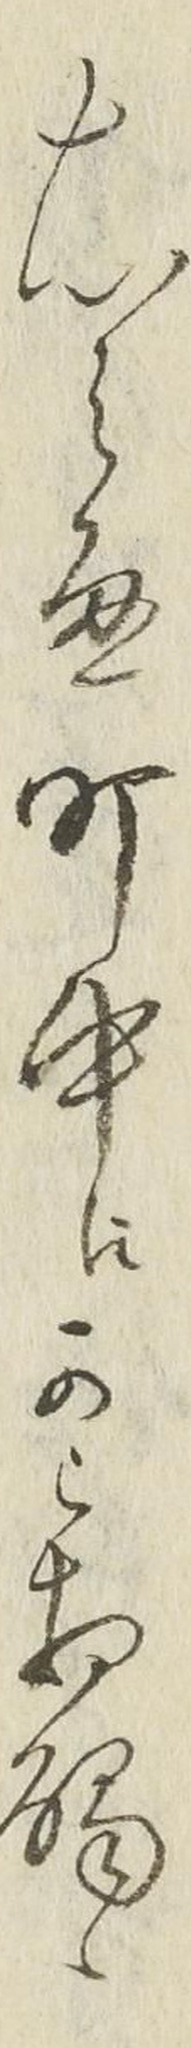右之通町中え可被相触候
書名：安政二乙卯年十月二日大地震之事
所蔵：東京大学地震研究所図書室 Earthquake Research Institute Library, The University of Tokyo, JAPAN
